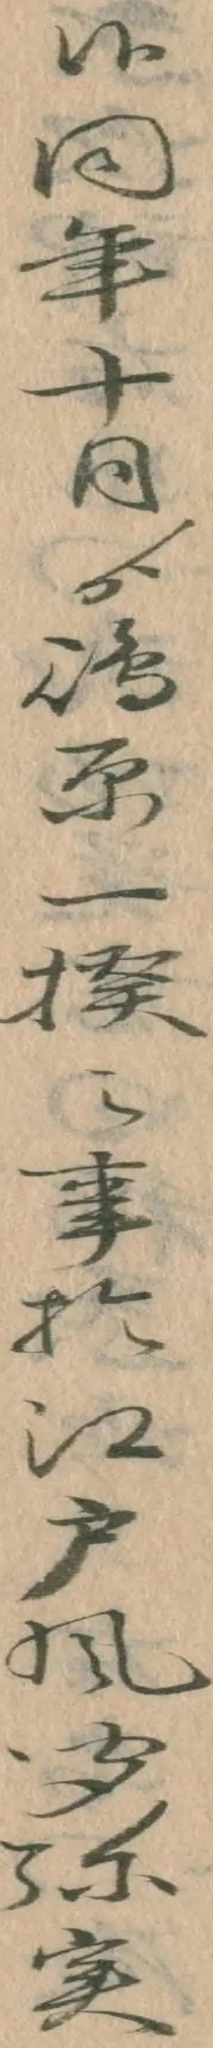候同年十月ゟ島原一揆之事於江戸風聞弥実
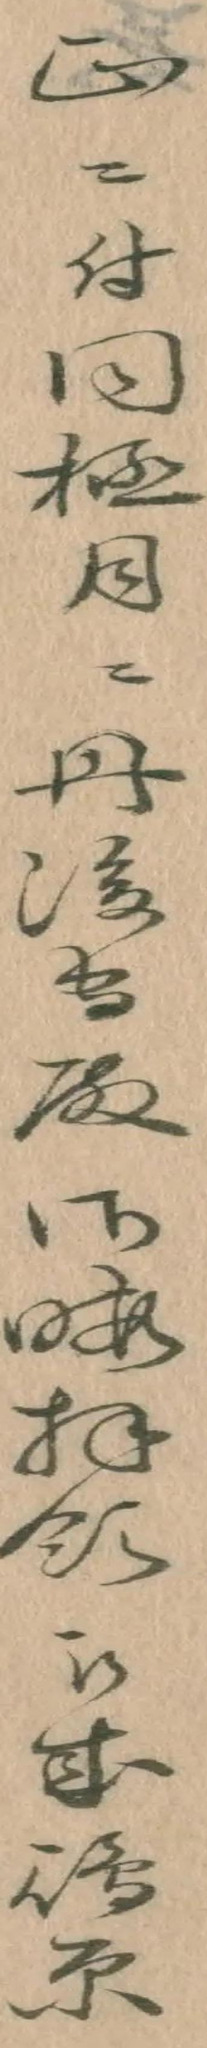正に付同極月に丹波守殿御暇相願被成島原
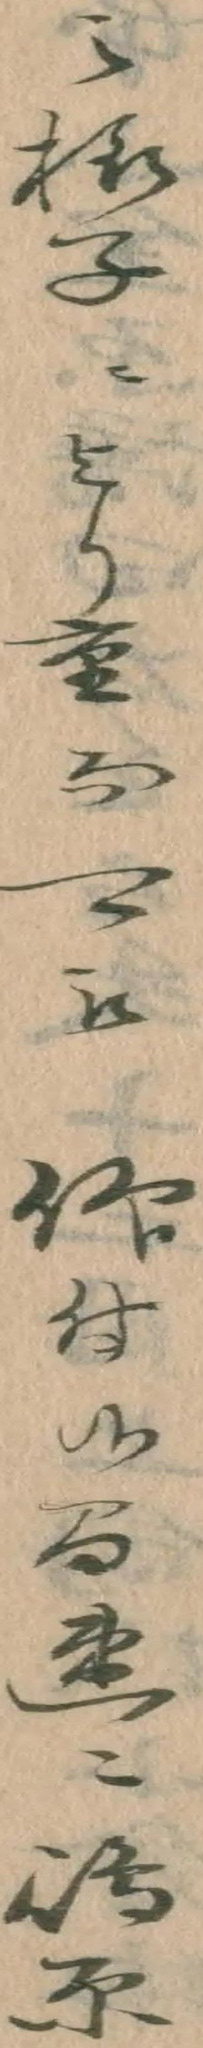之様子により重而可被仰付候間速に島原
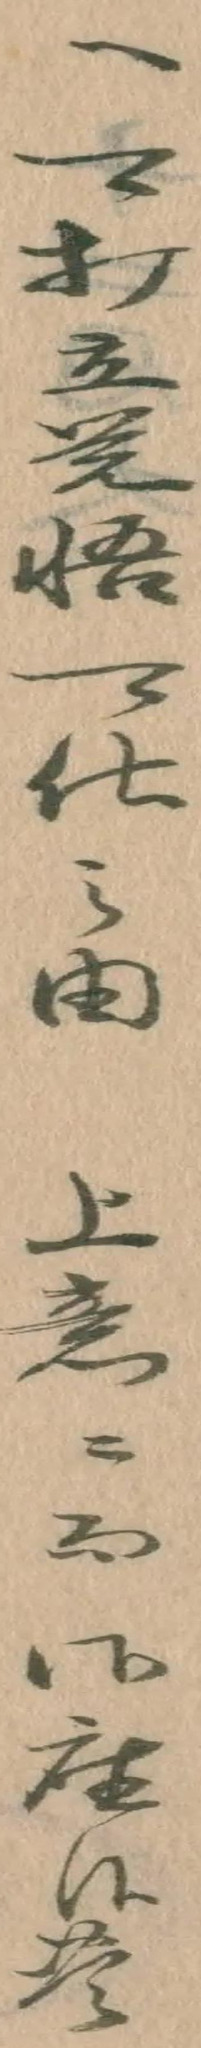へ可打立覚悟可仕之由上意に而御座候豊
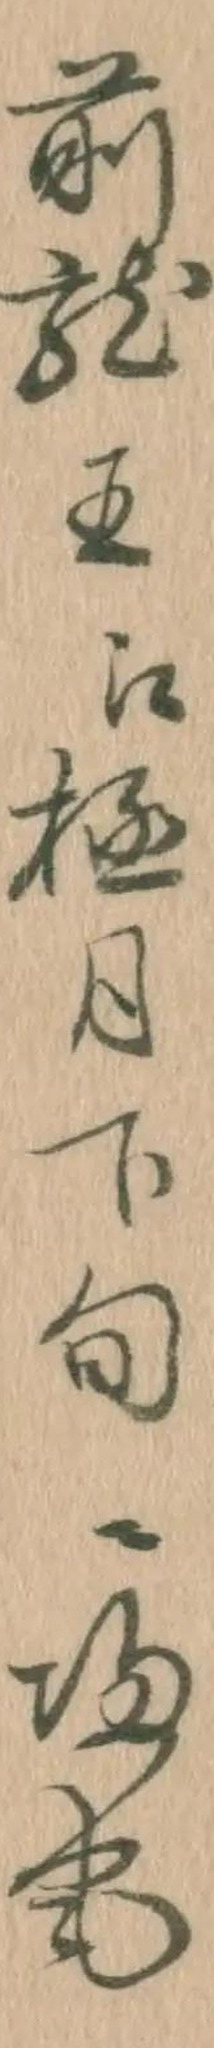前竜王江極月下旬に帰宅
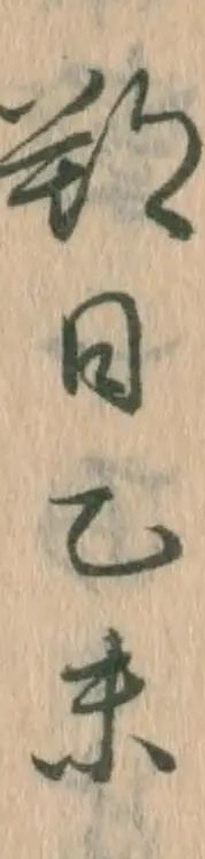朔日乙未
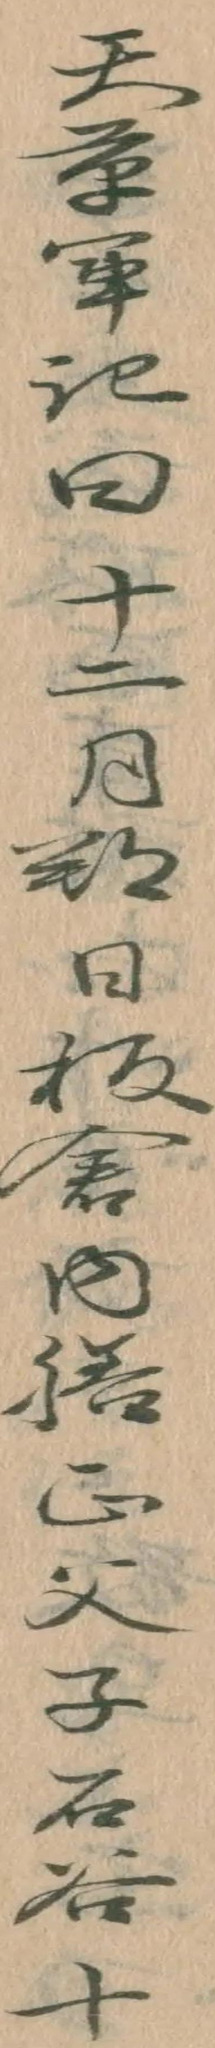天草軍記曰十二月朔日板倉内膳正父子石谷十
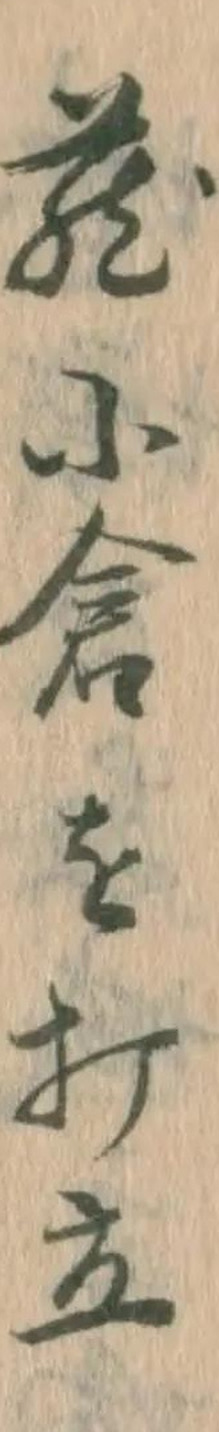蔵小倉を打立
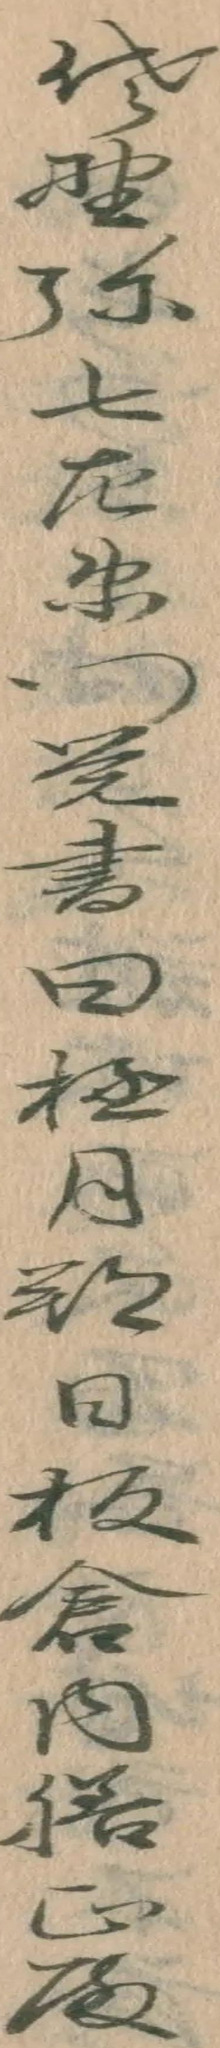佐野弥七左衛門覚書曰極月朔日板倉内膳正殿
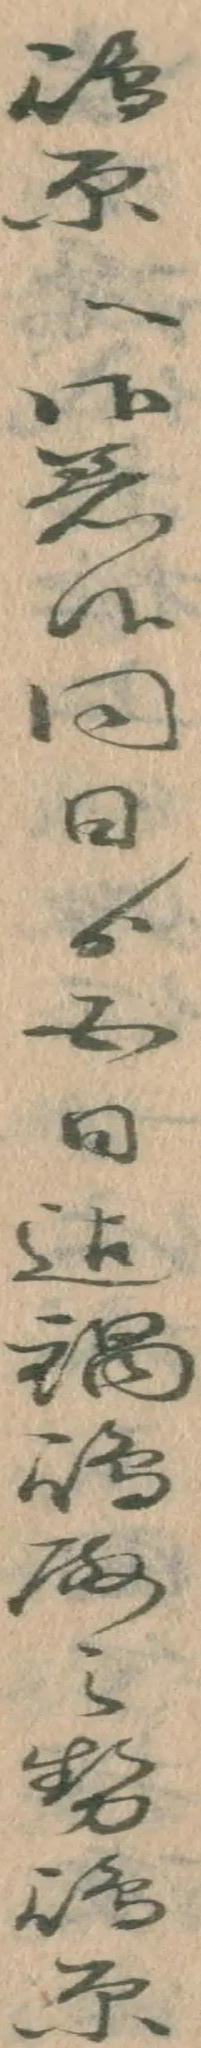島原へ御着候同日ゟ五日迄鍋島殿之勢島原
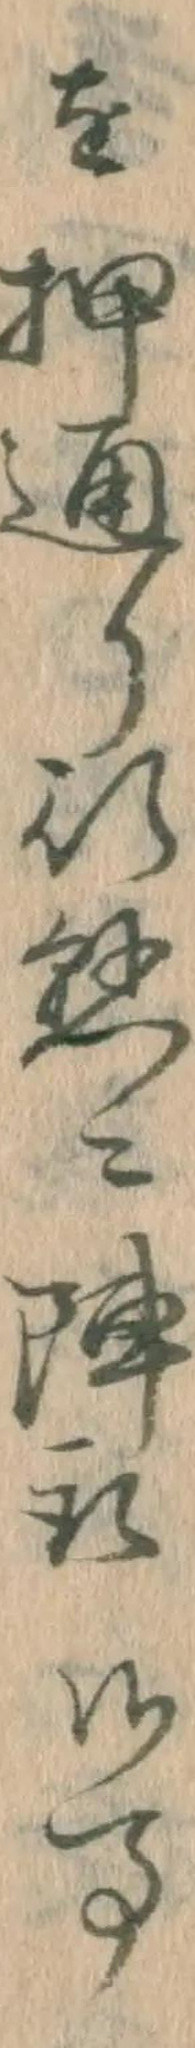を押通り行懸に陣取候事
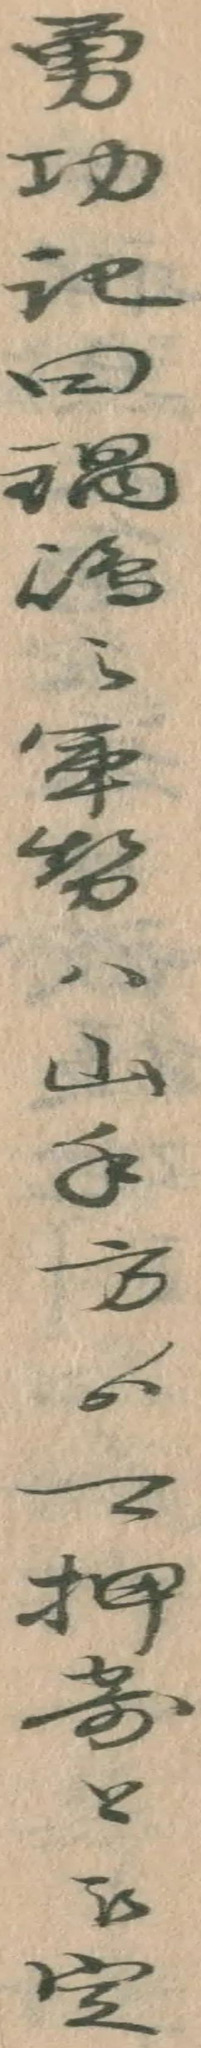勇功記曰鍋島之軍勢は山手方ゟ可押寄と被定
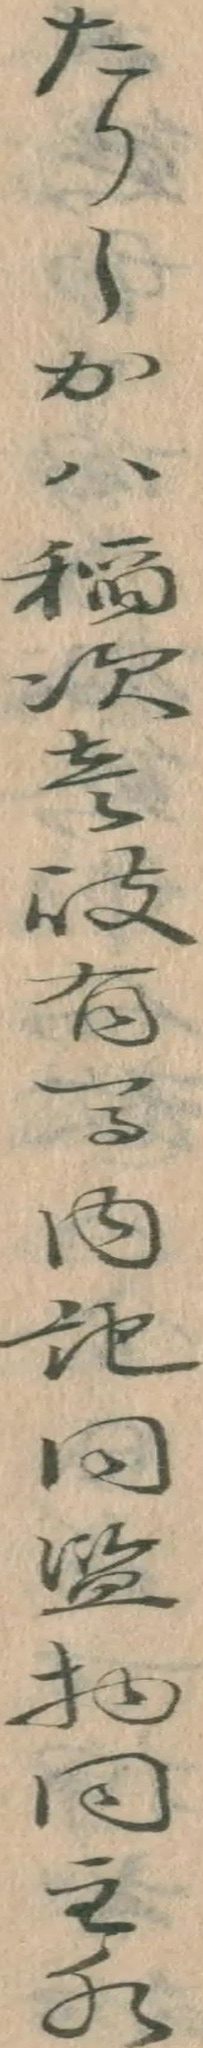たりしかは稲次壱岐有馬内記同監物同主水
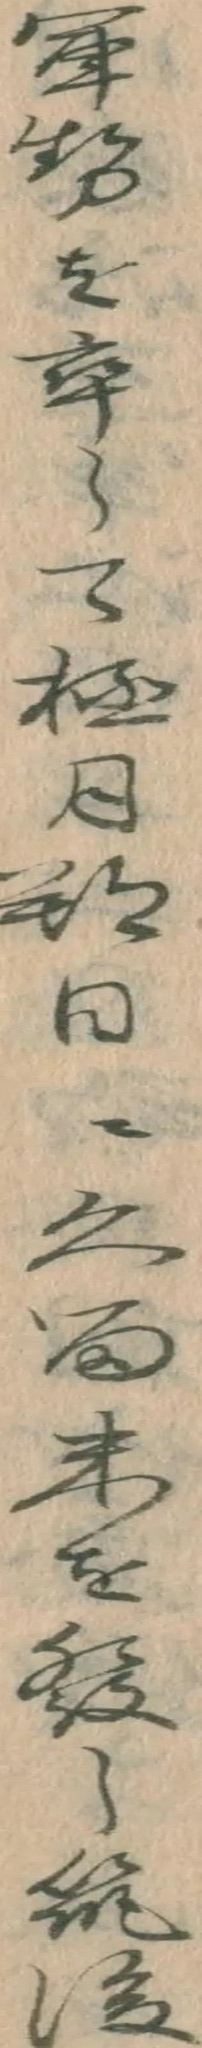軍勢を卒して極月朔日に久留米を発し筑後
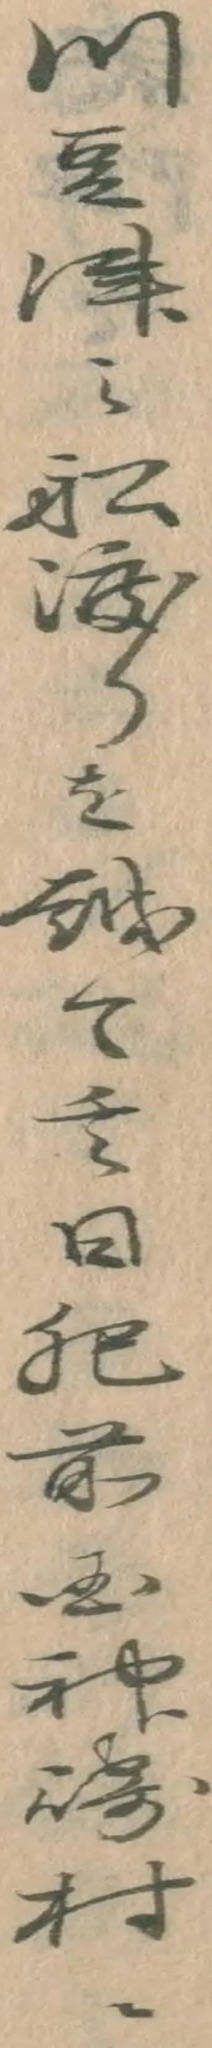川豆津之船渡りを超て其日肥前国神崎村に

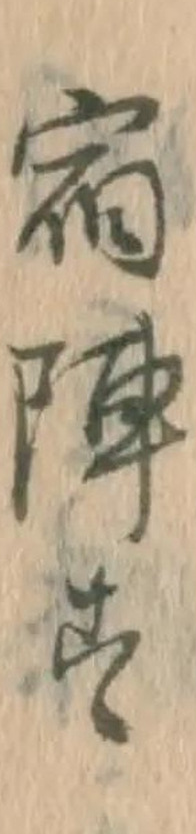宿陣す
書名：切支丹御退治記 49巻. [3]
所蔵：国立国会図書館 National Diet Library, JAPAN
